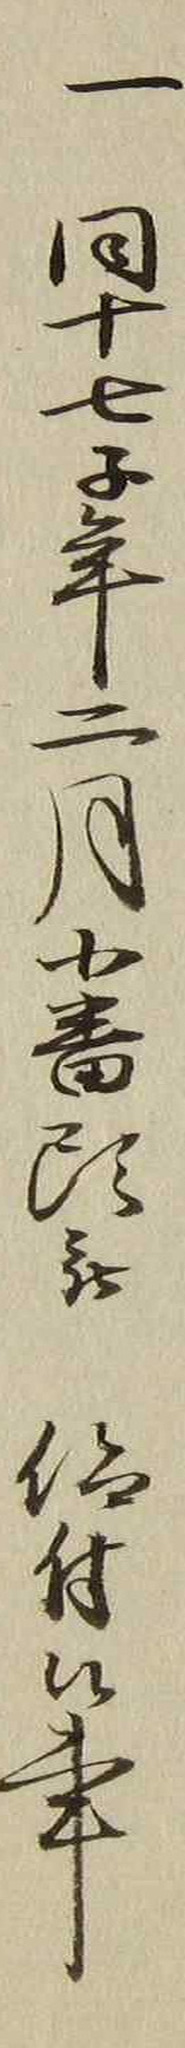一同十七子年二月小番頭被仰付候事
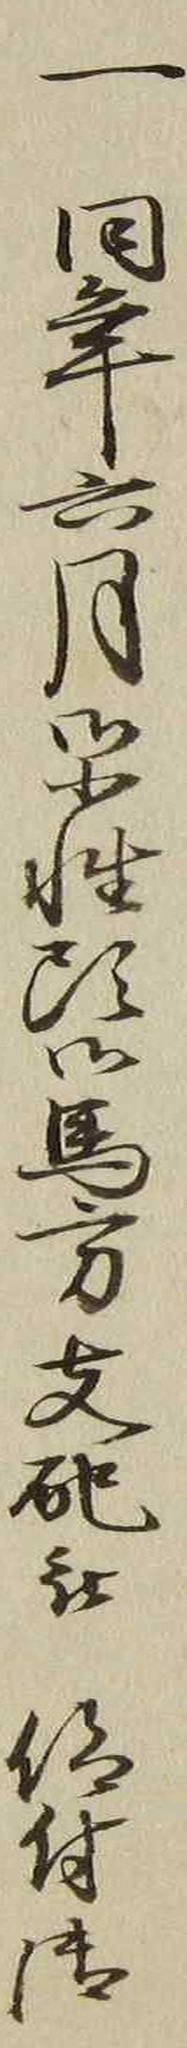一同年六月御小姓頭御馬方支配被仰付御
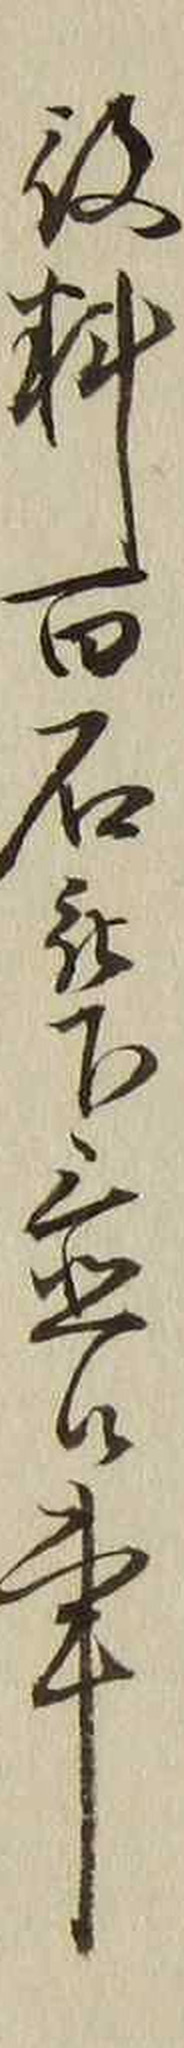役料百石被下置候事
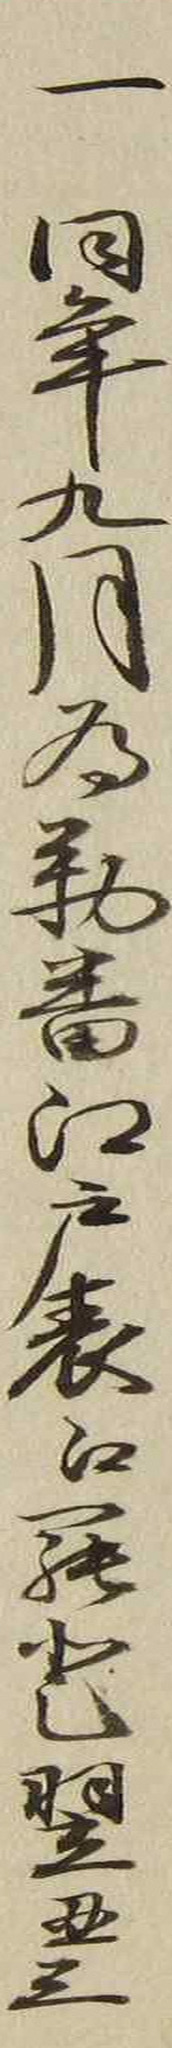一同年九月為勤番江戸表江罷登翌丑三
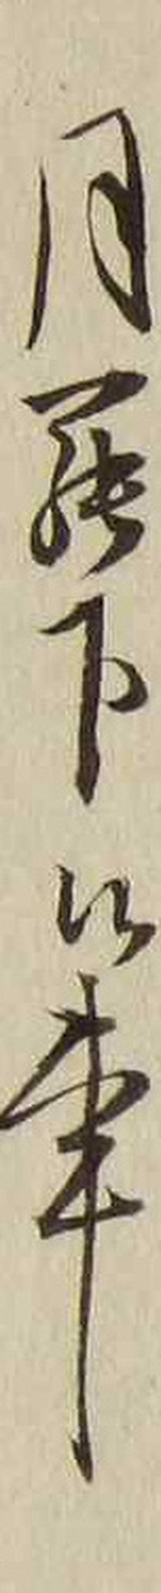月罷下候事
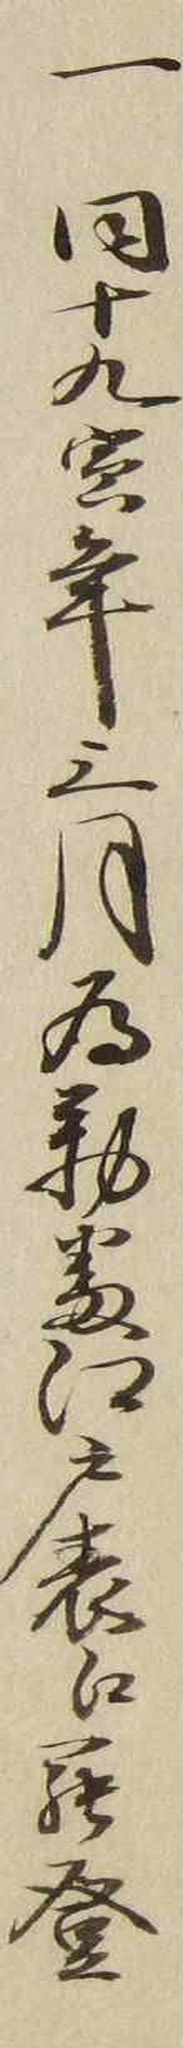一同十九寅年三月為勤番江戸表江罷登

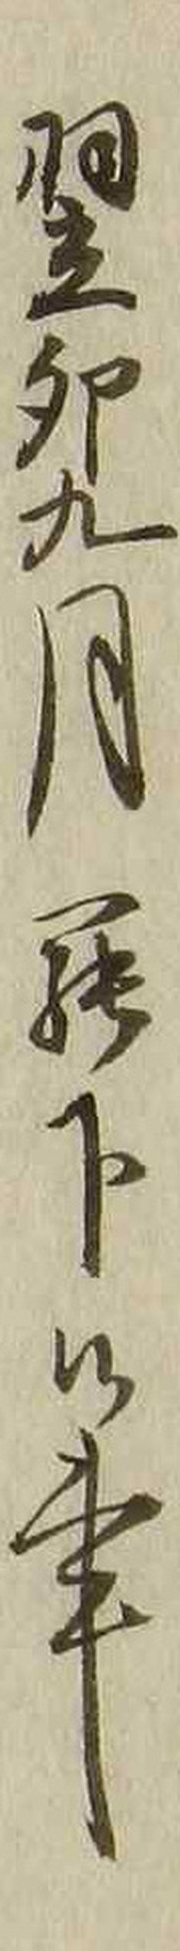翌夘九月罷下候事
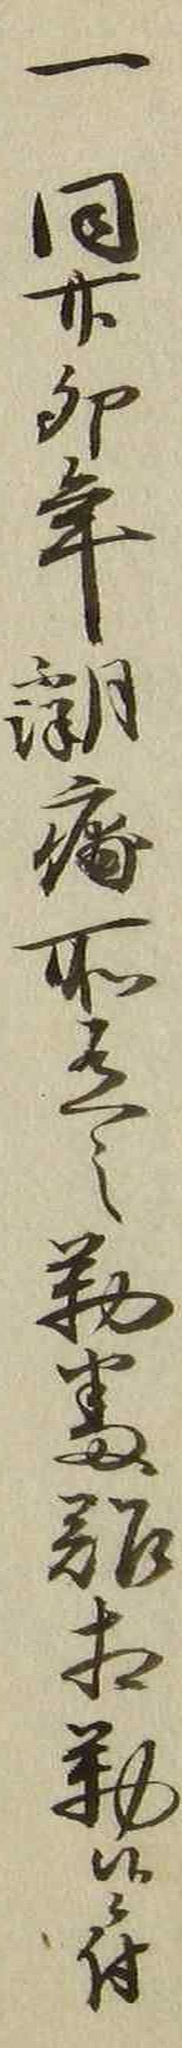一同廿夘年月ふ詳痛所有之勤番難相勤候二付
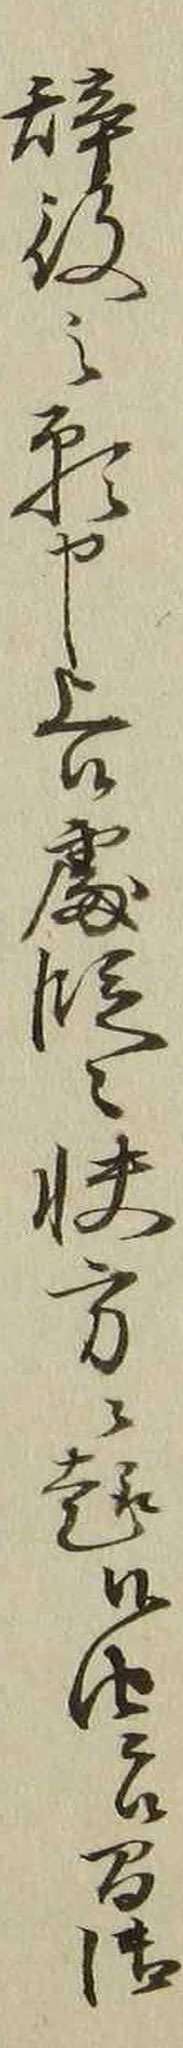辞役之願申上候處段々快方二趣候由ニ候間御
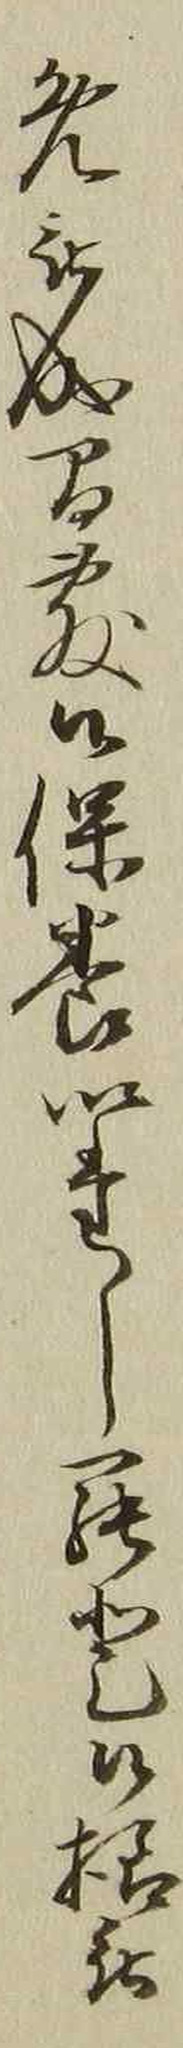免被成間敷候保養いたし罷登候様被
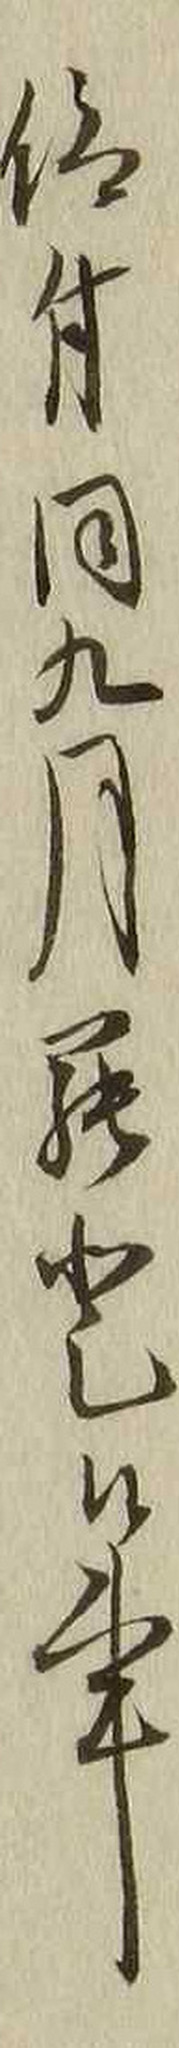仰付同九月罷登候事
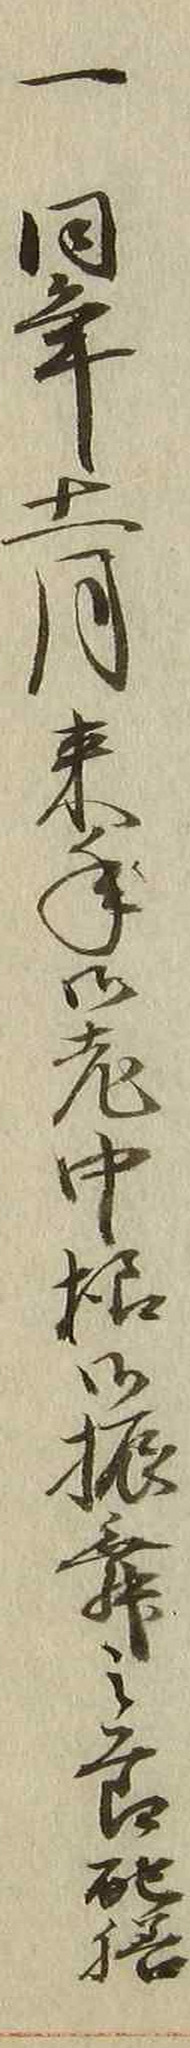一同年十一月来年御老中様御振舞之節配膳
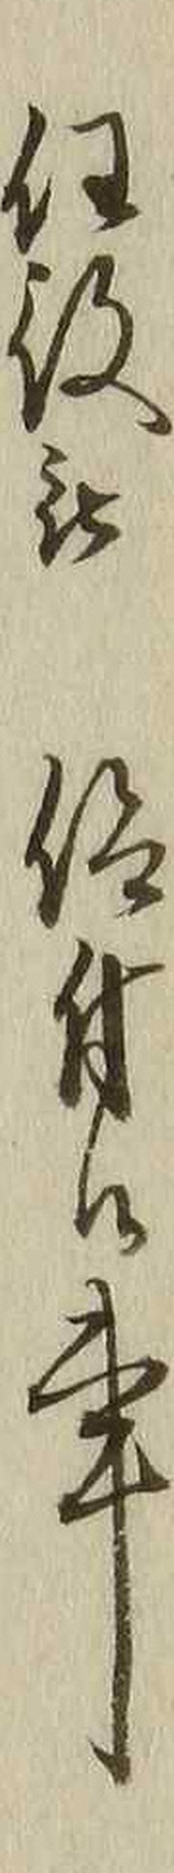伺役被仰付候事
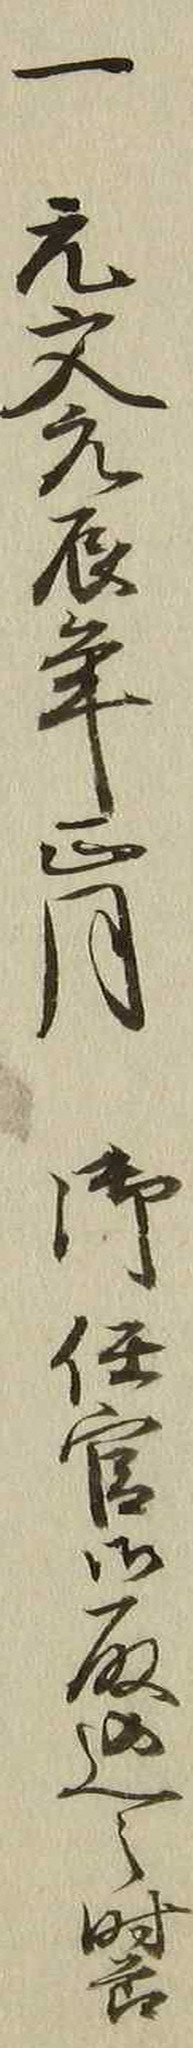一元文元辰年正月御任官御取込之時節
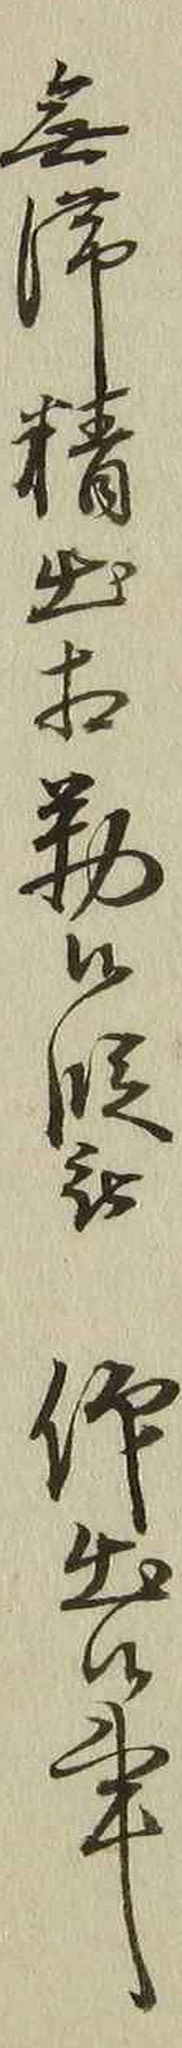無滞精出相勤候段被仰付候事
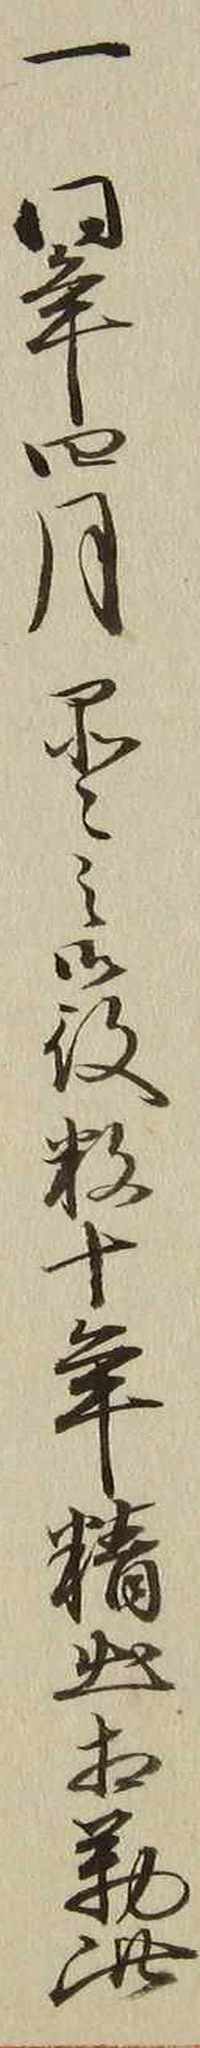一同年四月品々之御役数十年精出相勤此
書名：諸士系譜　巻之114　か之部22
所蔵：会津若松市立会津図書館
